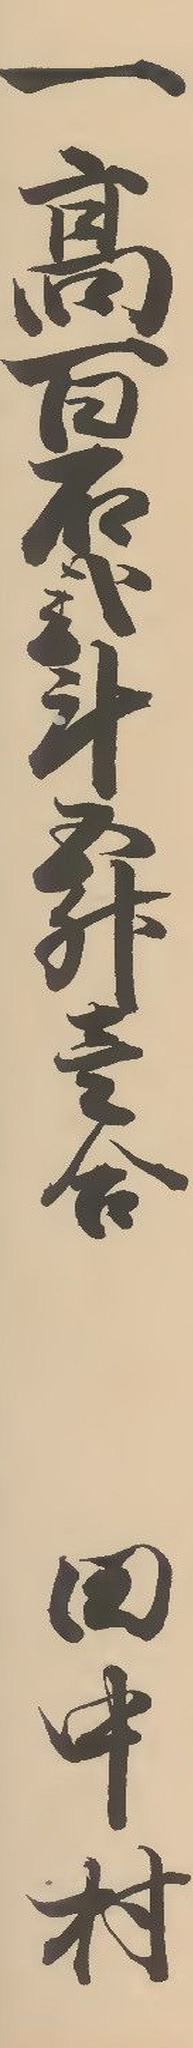一髙百石弐斗五升壱合田中村
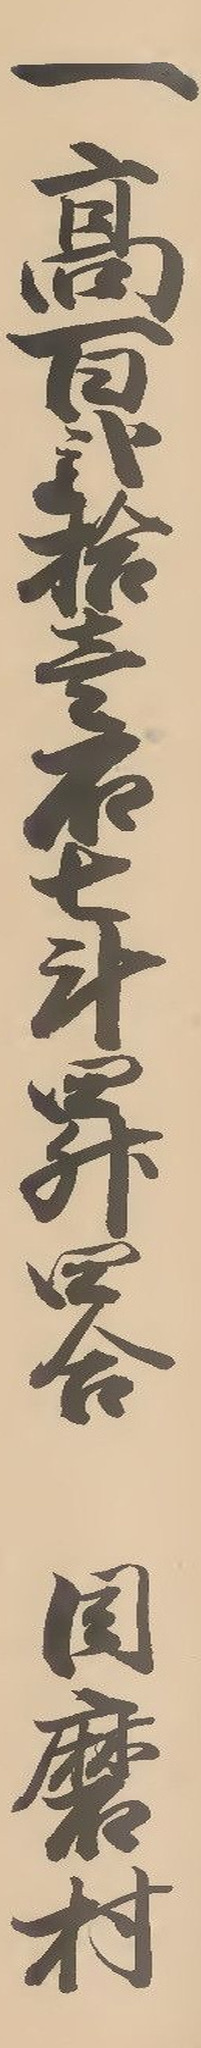一髙百弐拾壱石七斗四升四合目磨村
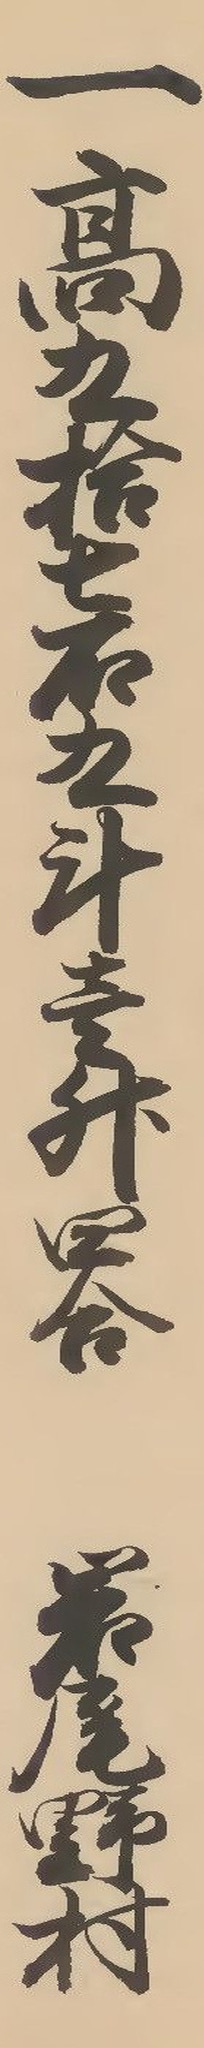一髙九拾七石九斗壱升四合岩尾野村
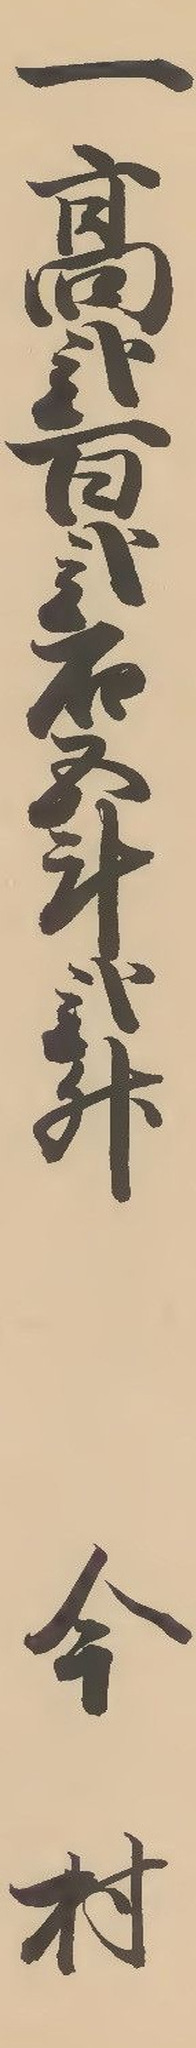一髙弐百弐石五斗弐升今村
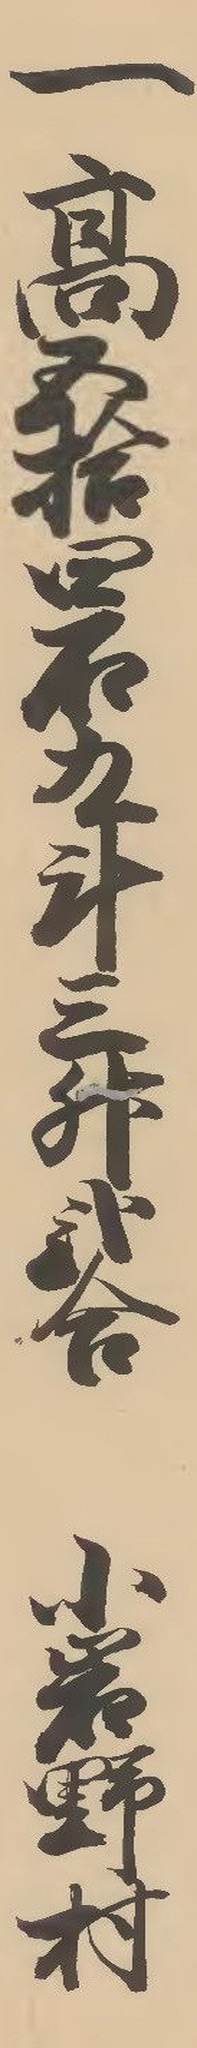一髙五拾四石九斗三升弐合小岩野村

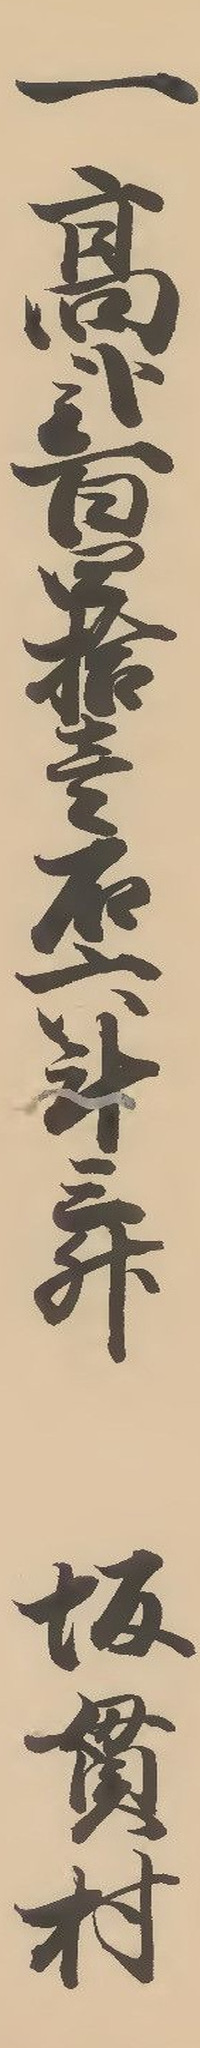一髙弐百四拾壱石六斗三升坂貫村
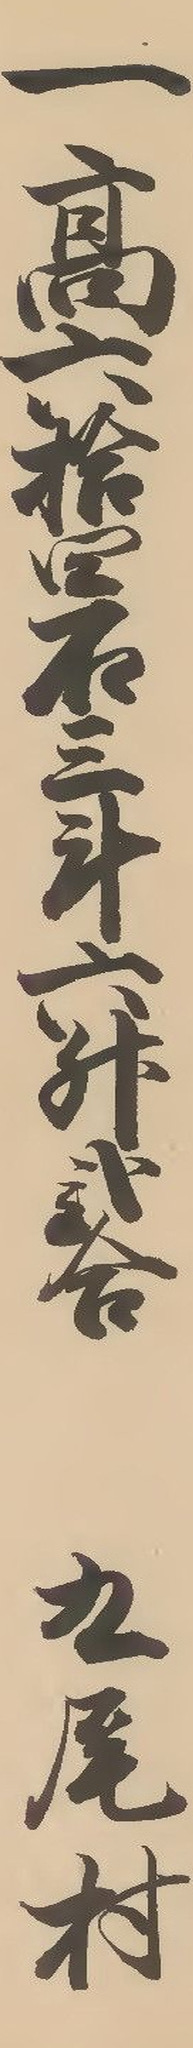一髙六拾四石三斗六升弐合九尾村
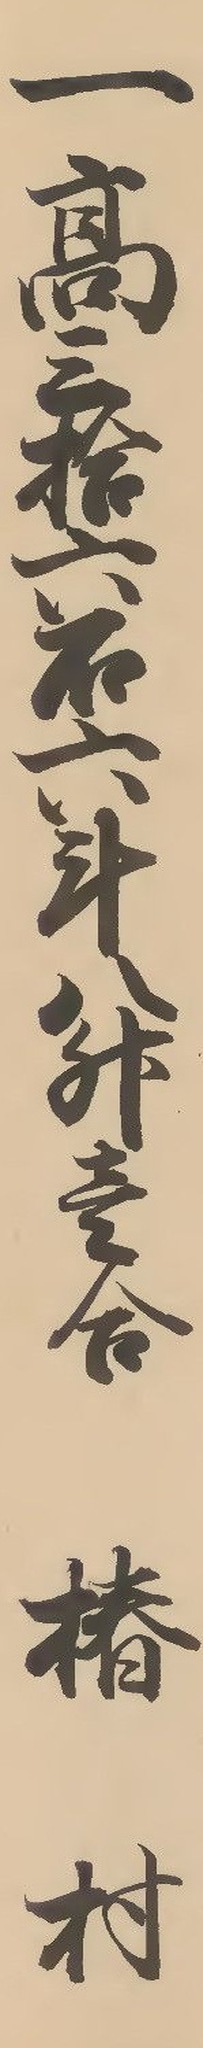一髙三拾六石六斗八升壱合椿村
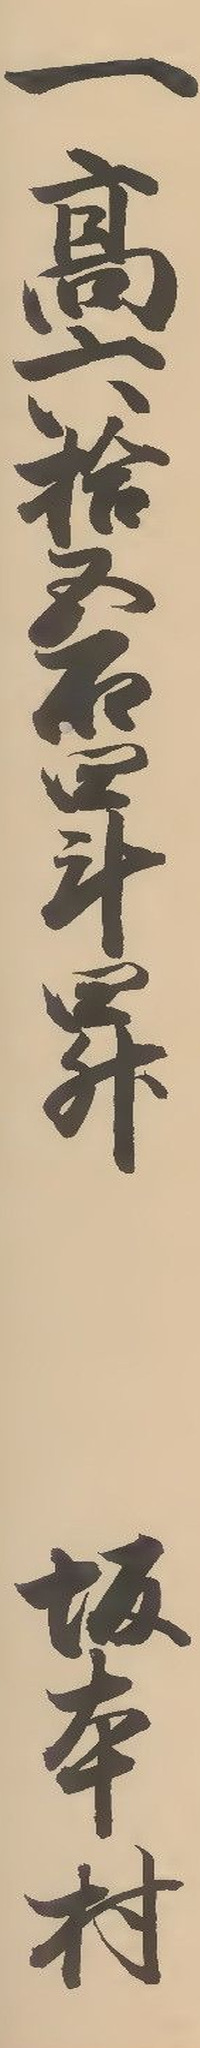一髙六拾五石四斗四升坂本村
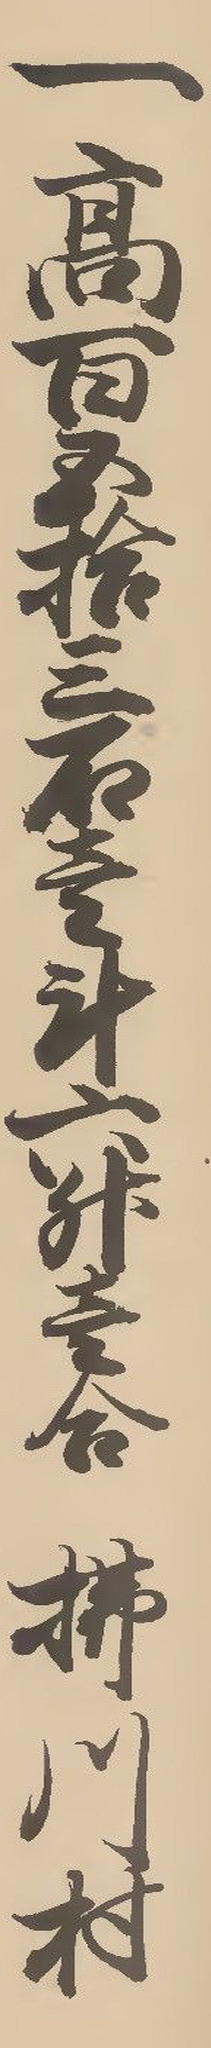一髙百五拾三石壱斗六升壱合拂川村
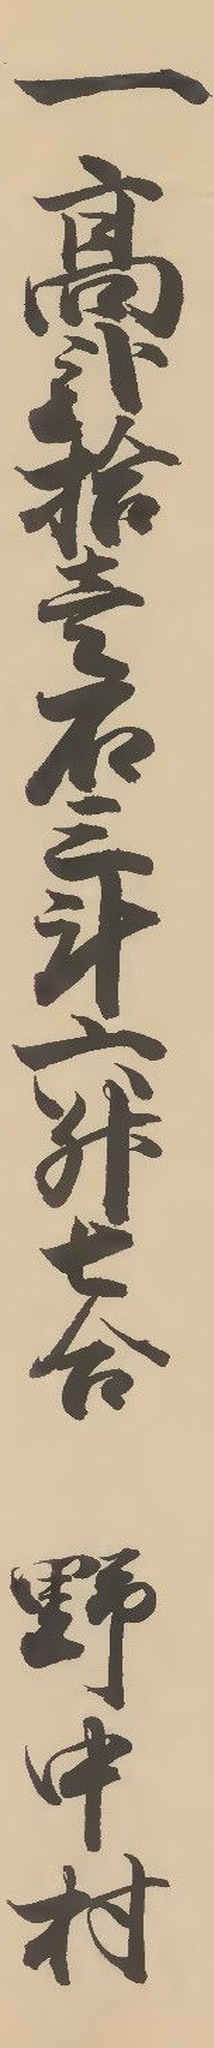一髙弐拾壱石三斗六升七合野中村
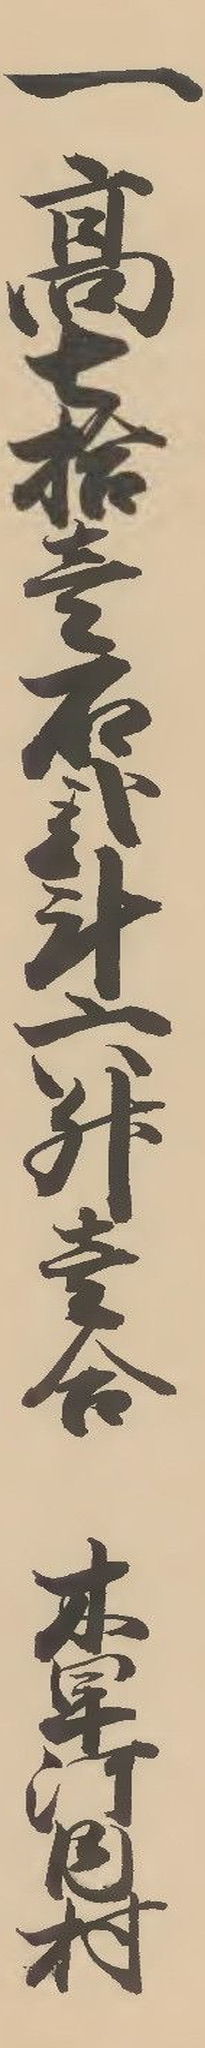一髙七拾壱石弐斗六升壱合木早河内村
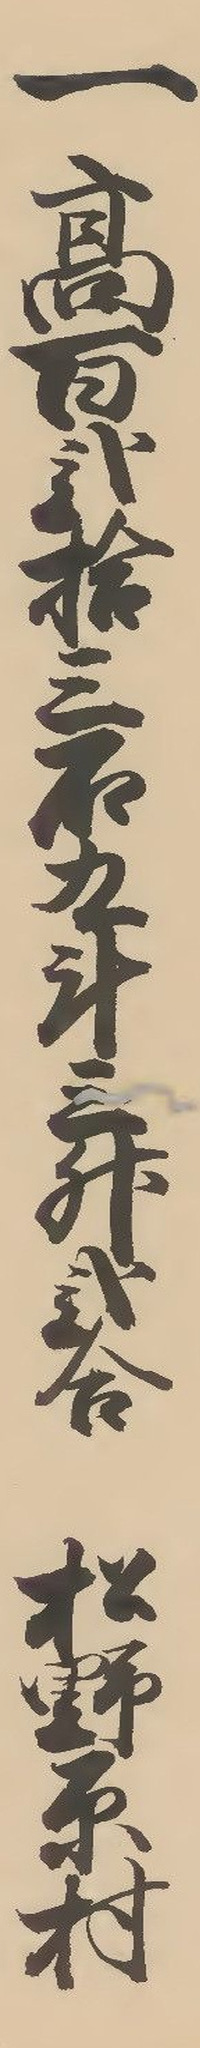一髙百弐拾三石九斗三升弐合松野原村

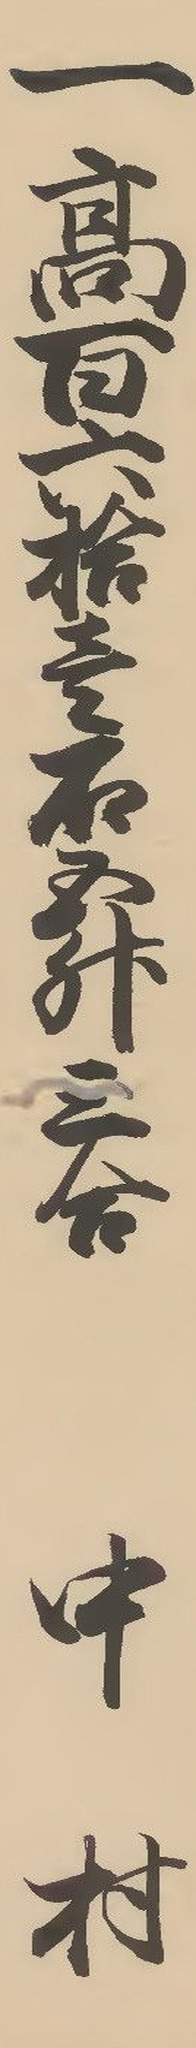一髙百六拾壱石五升三合中村
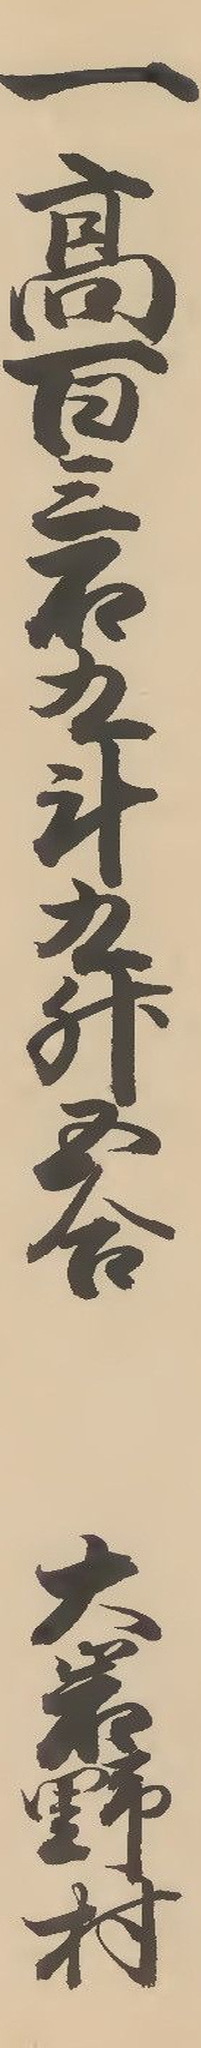一髙百三石九斗九升五合大岩野村
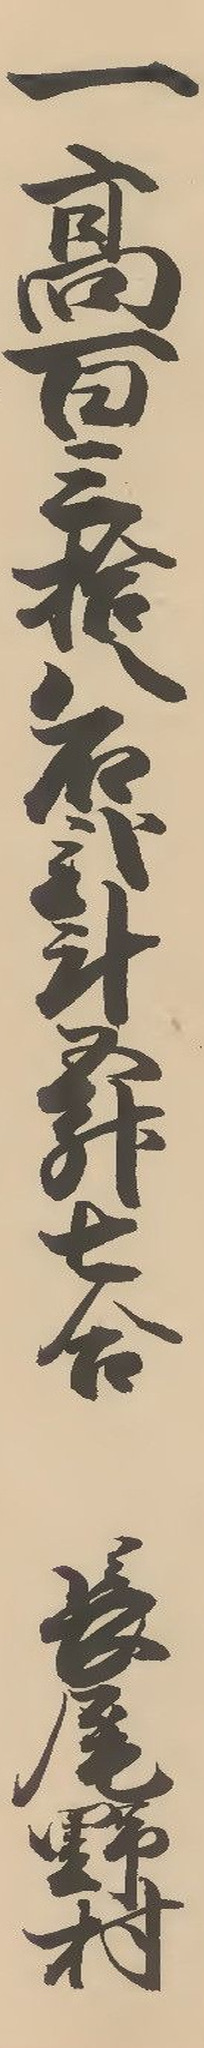一髙百三拾八石弐斗五升七合長尾野村
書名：肥後国郷帳
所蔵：国立公文書館 National Archives of Japan
